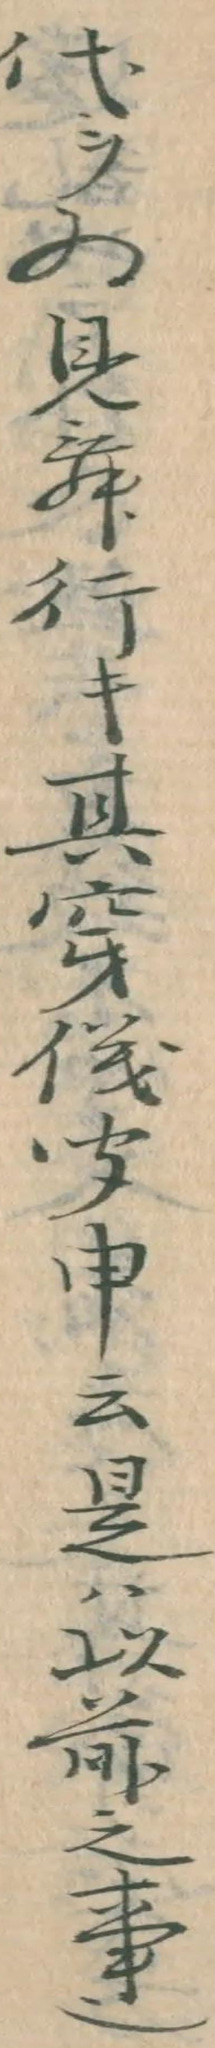代ヲ為見舞行キ其穿儀聞申云是ハ以前之事也
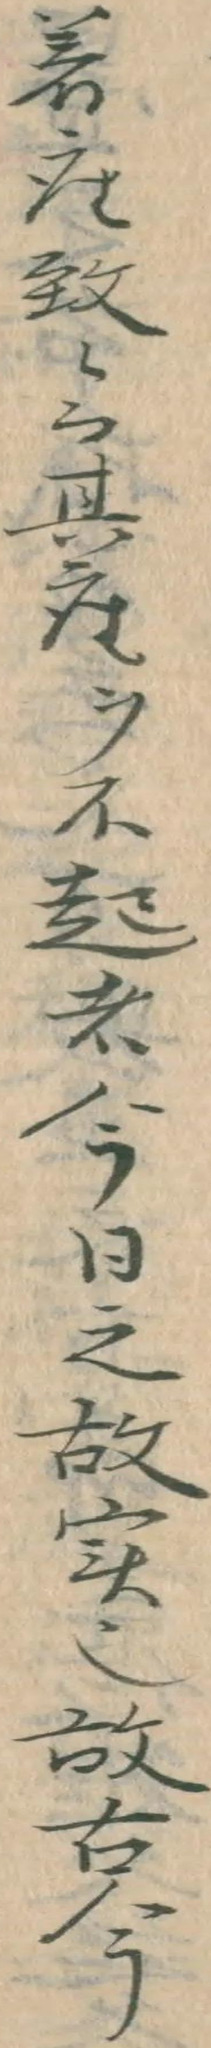着座致候而其座ヲ不起者今日之故実也故古今
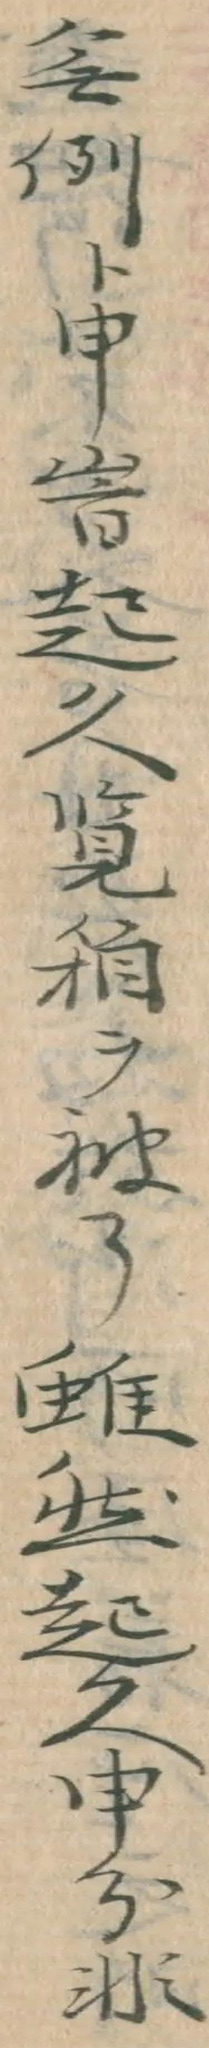無例ト申旹起久覧箱ヲ被了雖然起久申分非
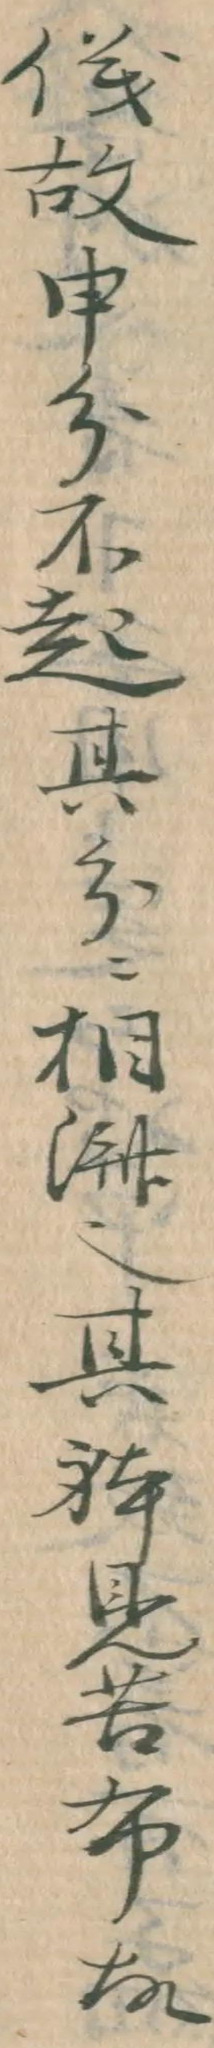儀故申分不起其分ニ相済也其体見苦布故
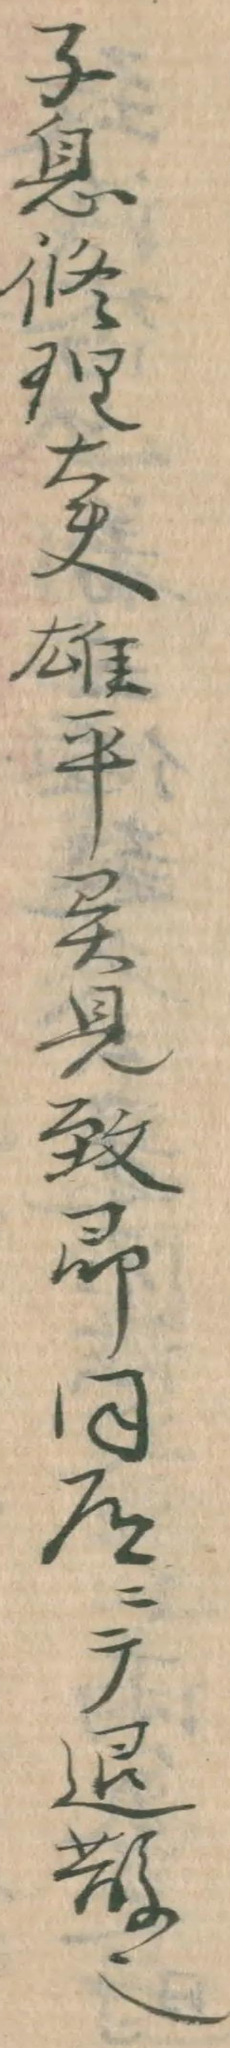子息修理大夫雄平異見致即同道ニテ退散也
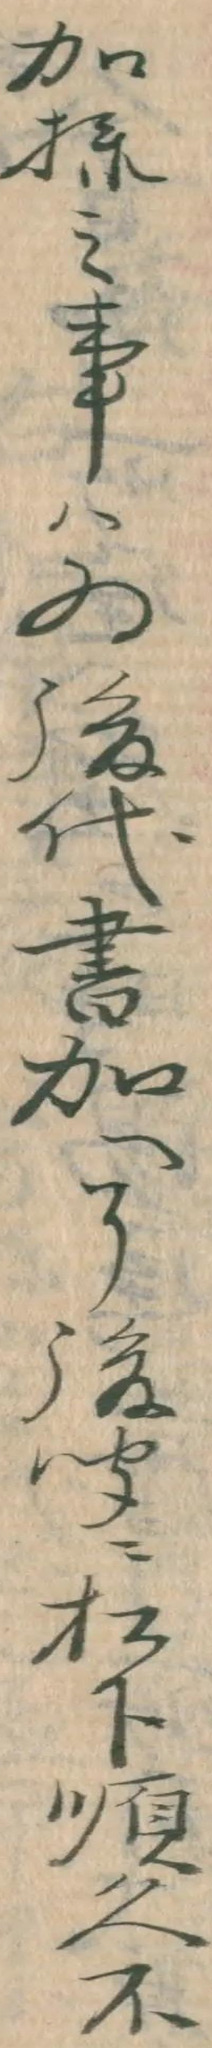加様之事ハ為後代書加へ了後聞ニ松下順久不
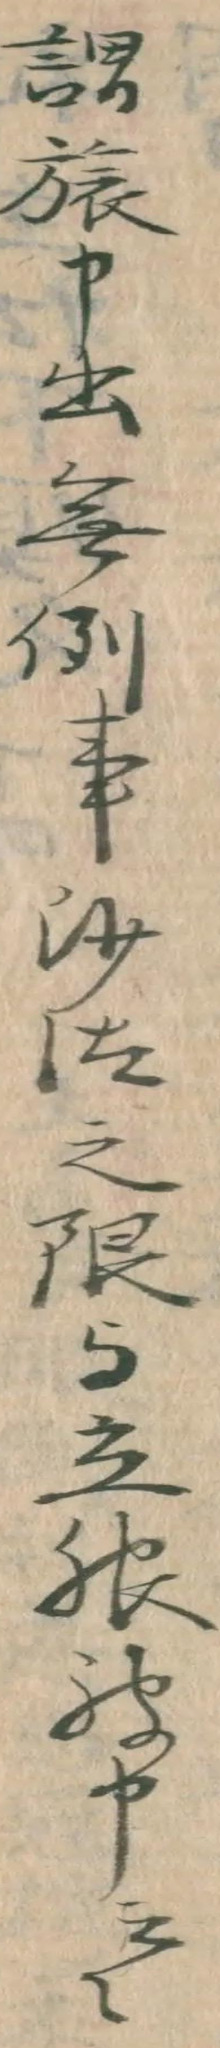謂旅申出無例事沙汰之限与立服被申云々
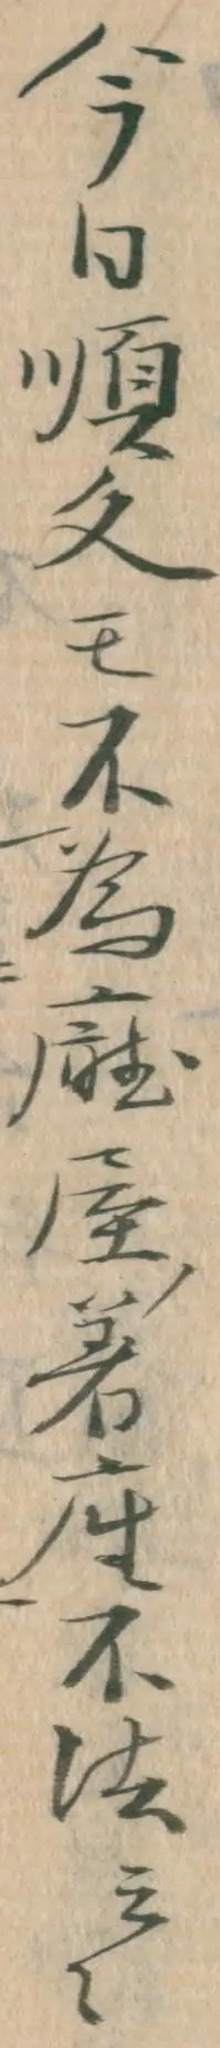今日順久モ不為庁屋ノ着座不法云々
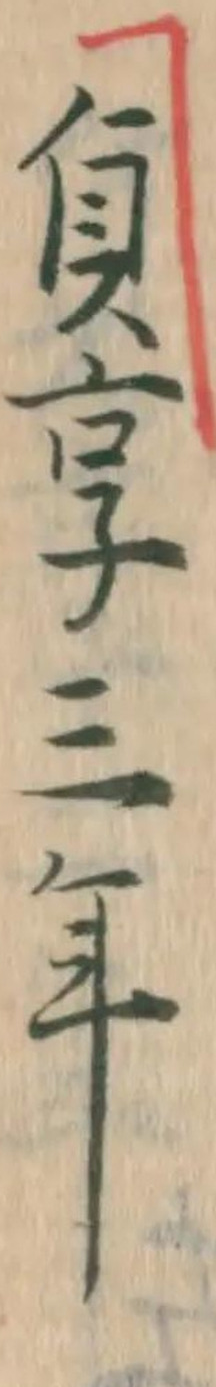貞享三年
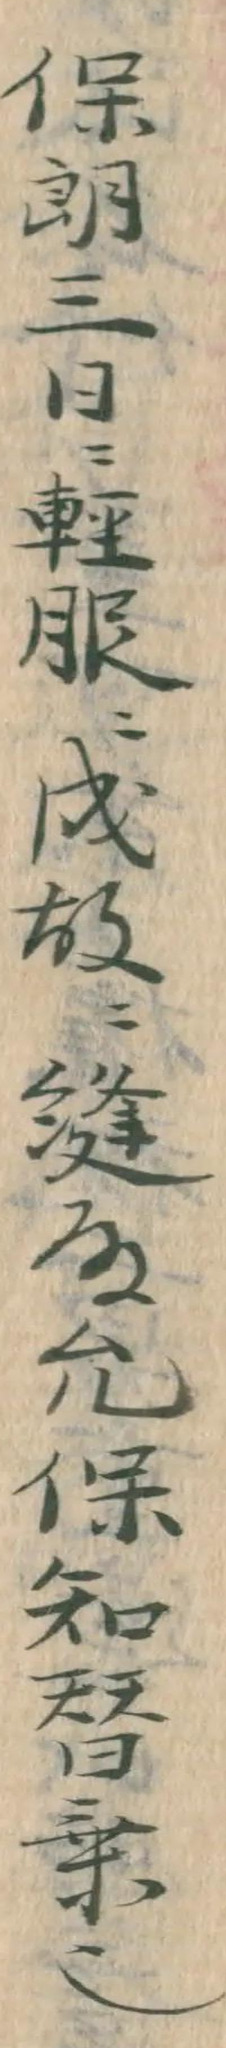保朗三日ニ軽服ニ成故ニ縫殿允保知替乗也
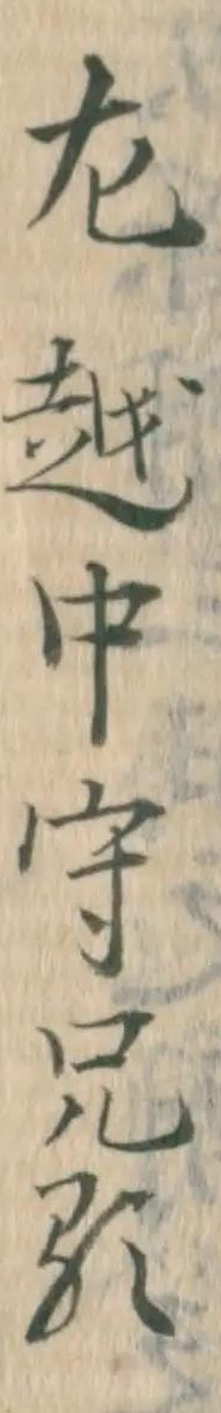左越中守兄顕
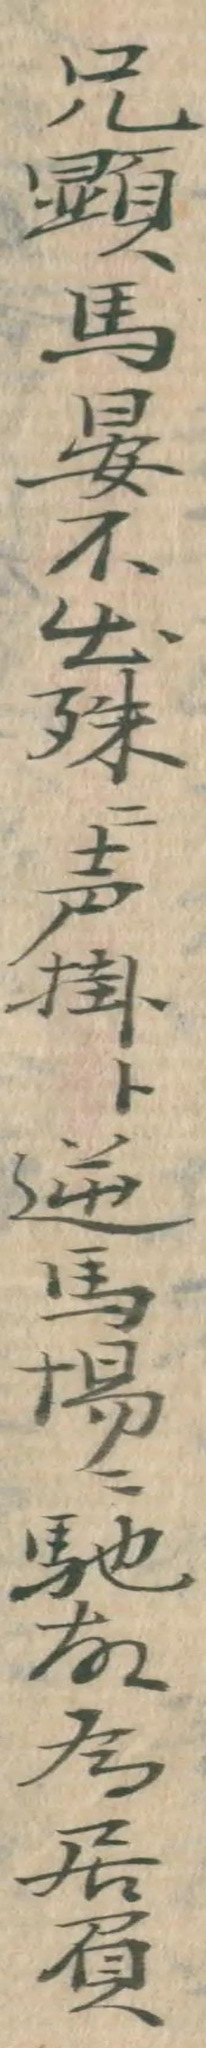兄顕馬晏不出殊ニ声掛ト逆馬場ニ馳故為居負
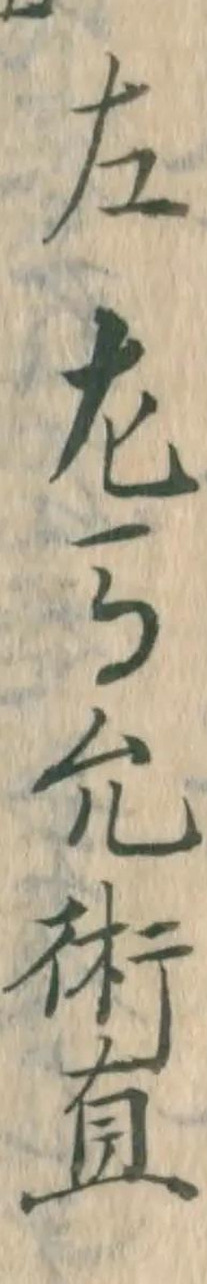左左馬允術直

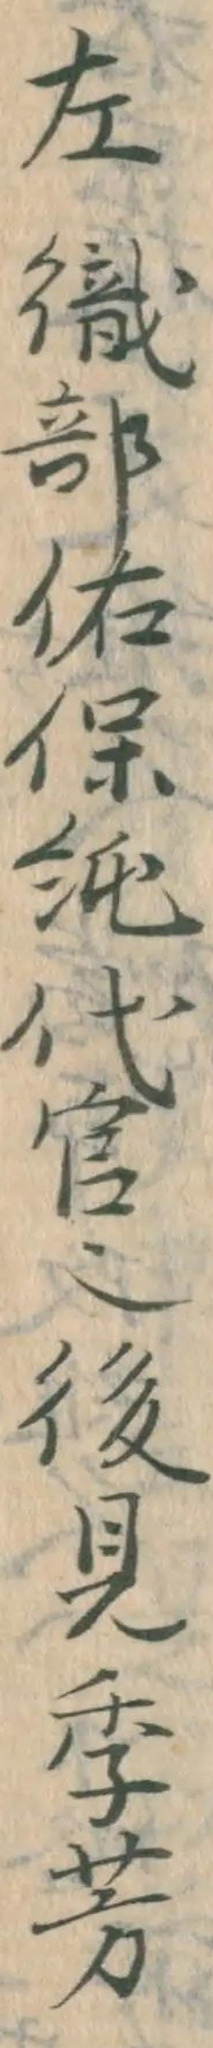左織部佑保純代官也後見季芳
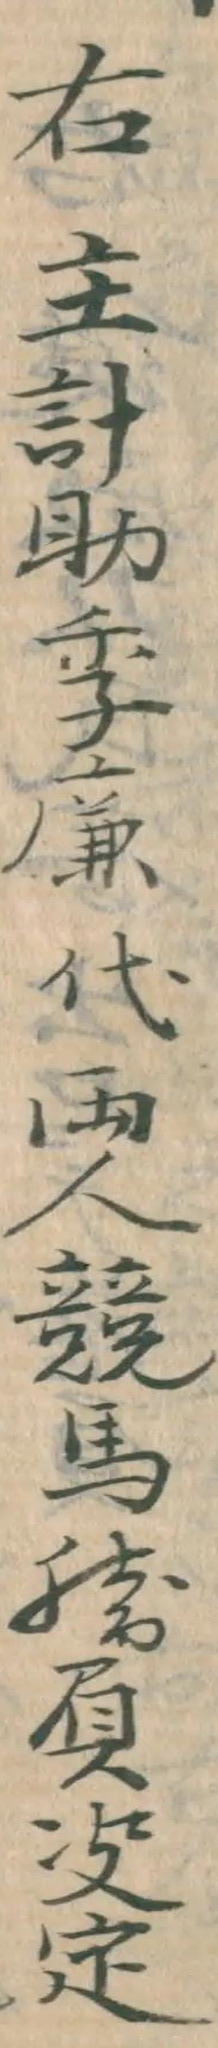右主計助季廉代両人競馬勝負決定
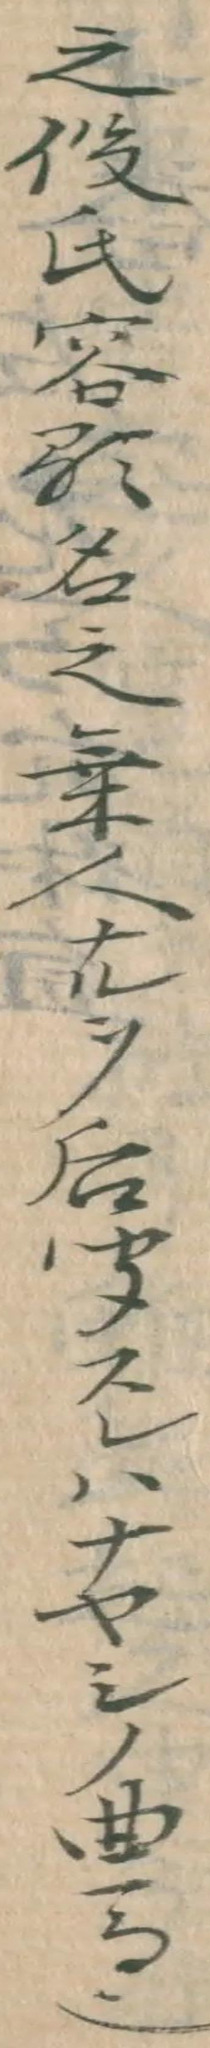之役氏容顕名之乗人ナルヲ后聞スレハナヤシノ曲馬也
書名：賀茂社記録. 第10冊
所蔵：国立国会図書館 National Diet Library, JAPAN
